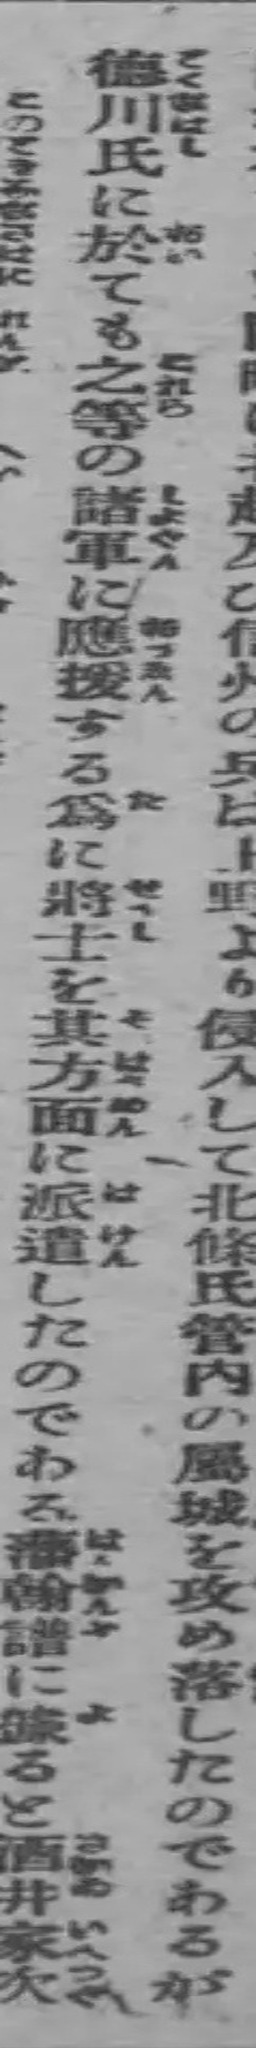家次の戦功徳川氏に於ても之等の諸軍に応援する為に将士を其方面に派遣したのである藩翰譜に拠ると酒井家次
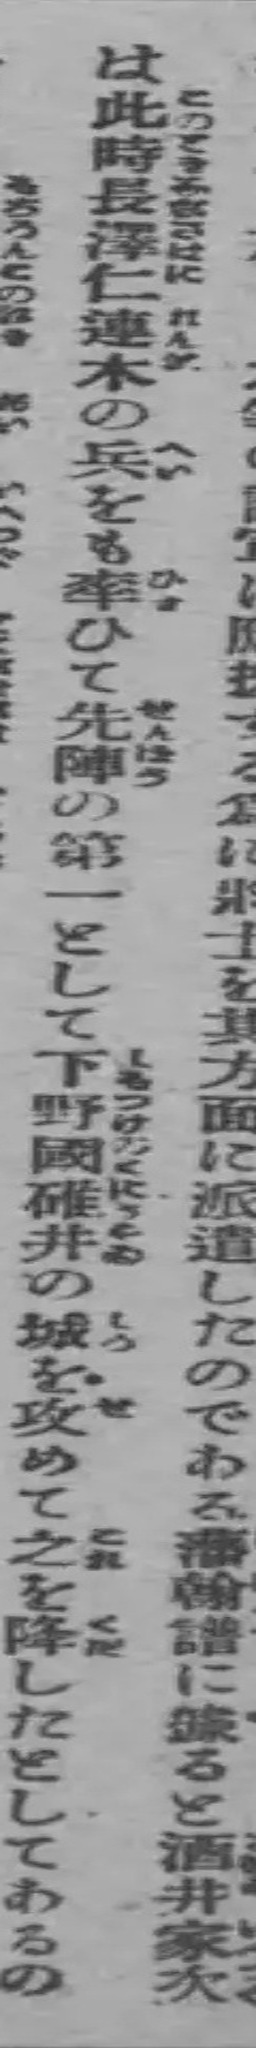は此時長沢仁連木の兵をも率ひて先陣の第一として下野国碓井の城を攻めて之を降したとしてあるの
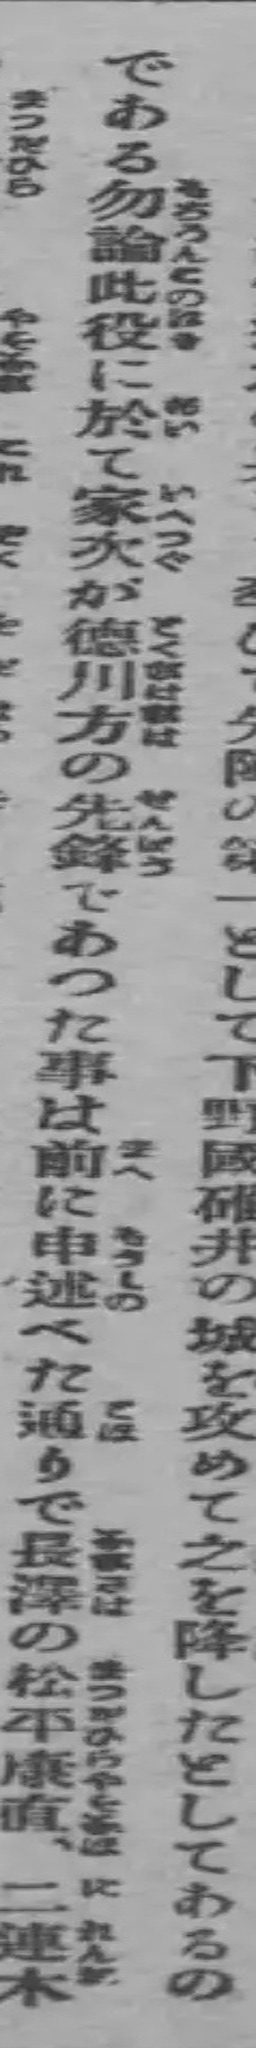である勿論此役に於て家次が徳川方の先鋒であつた事は前に申述べた通りで長沢の松平康直、二連木
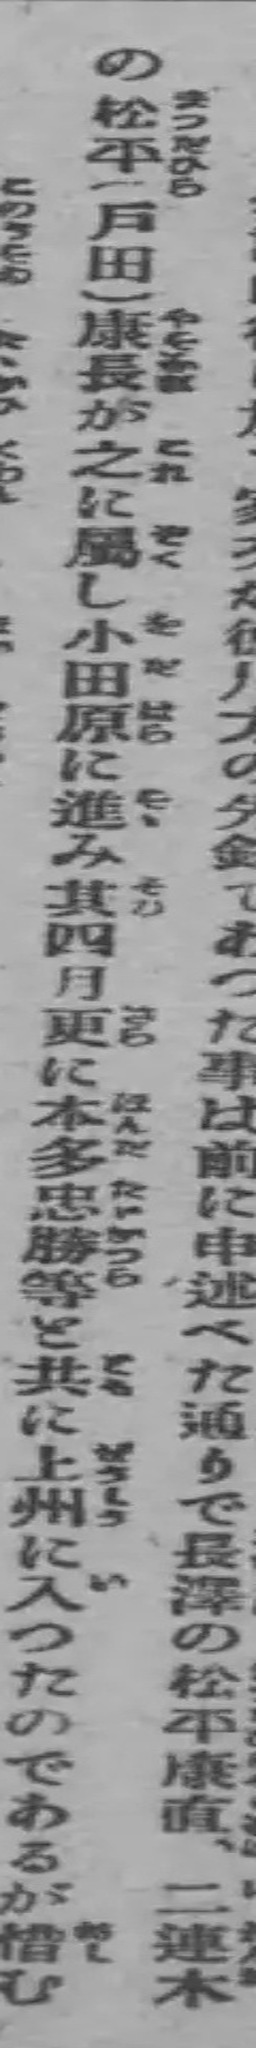の松平(戸田)康長が之に属し小田原に進み其四月更に本多忠勝等と共に上州に入つたのであるが惜む
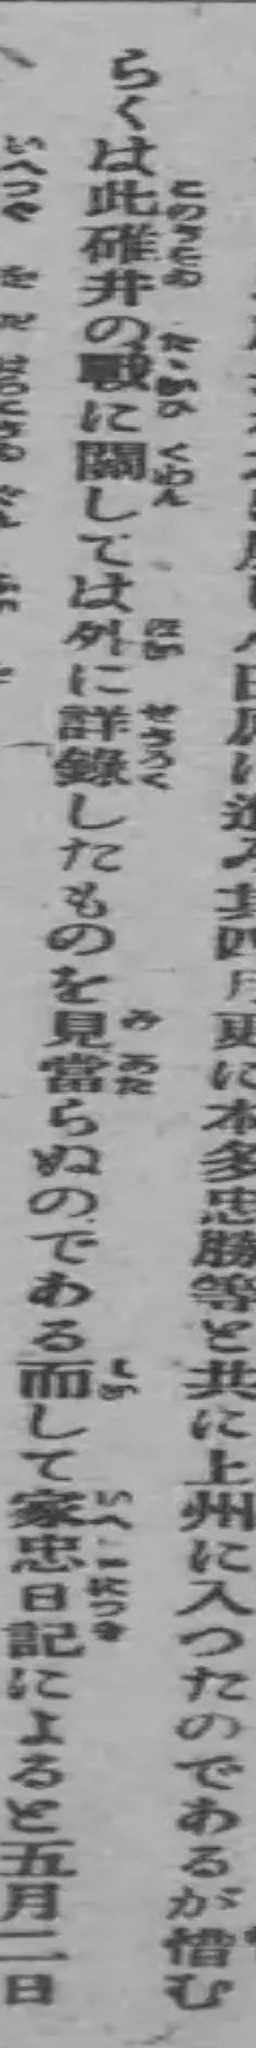らくは此碓井の戦に関しては外に詳録したものを見当らぬのである而して家忠日記によると五月二日
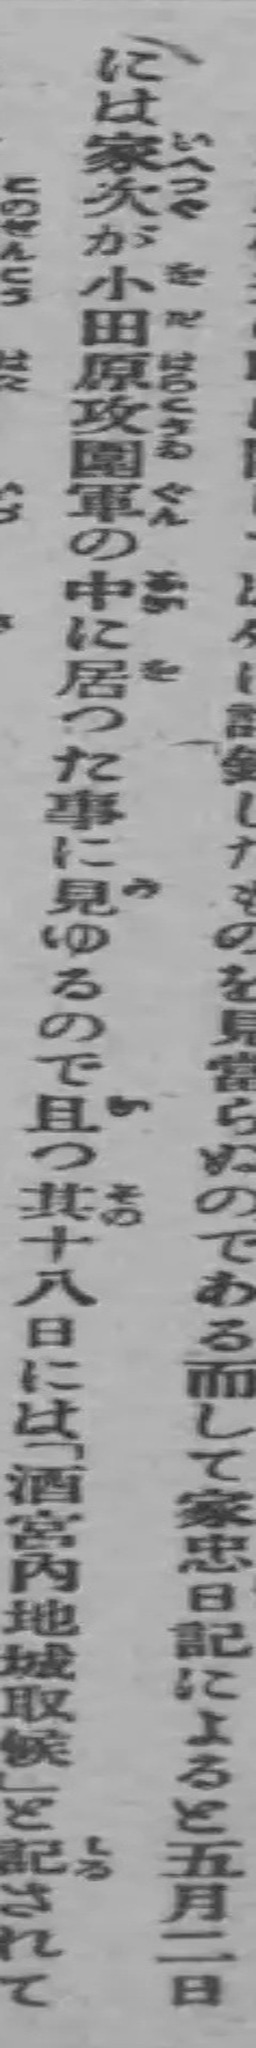には家次が小田原攻囲軍の中に居つた事に見ゆるので且つ其十八日には「酒宮内地城取候」と記されて
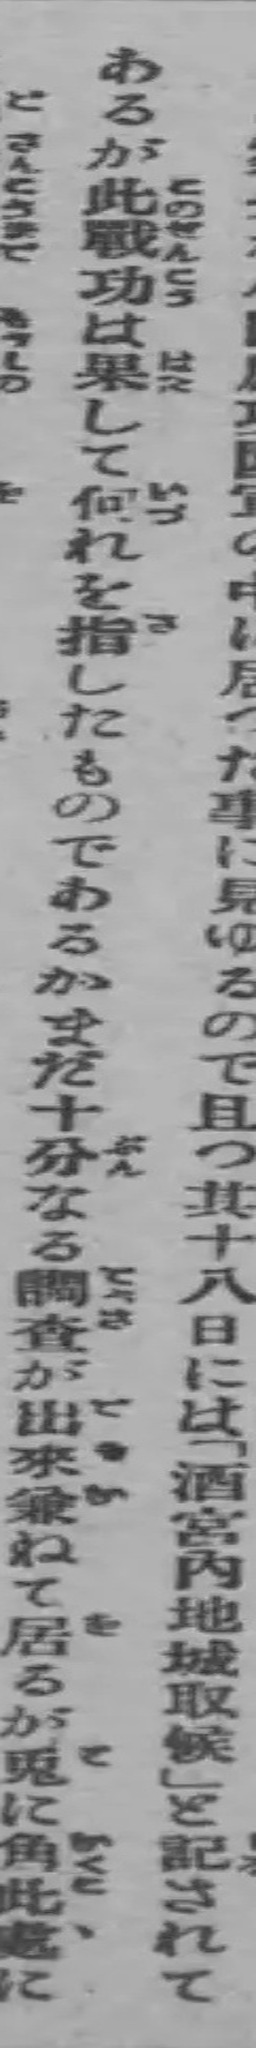あるが此戦功は果して何れを指したものであるかまだ十分なる調査が出来兼ねて居るが兎に角此処に
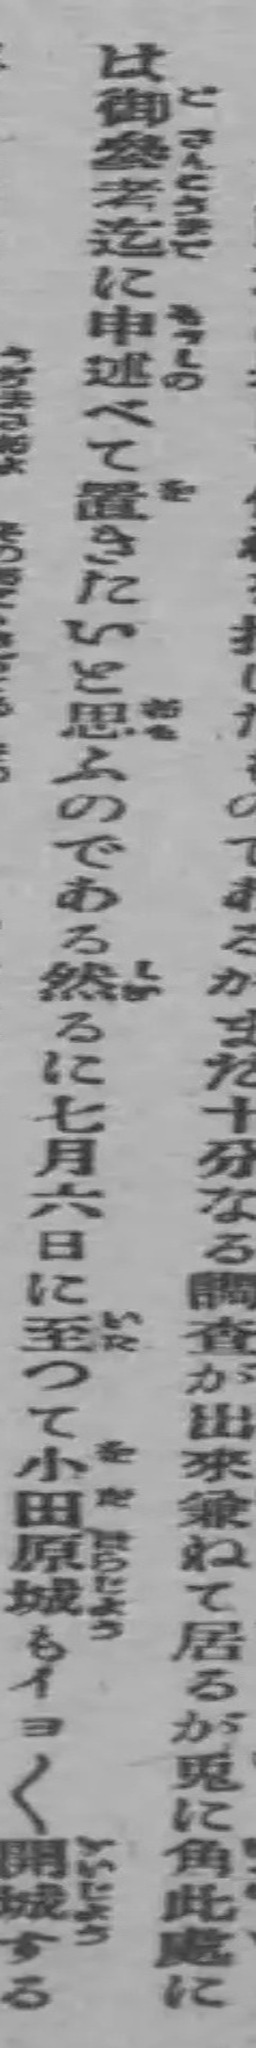は御参考迄に申述べて置きたいと思ふのである然るに七月六日に至つて小田原城もイヨ〳〵開城する
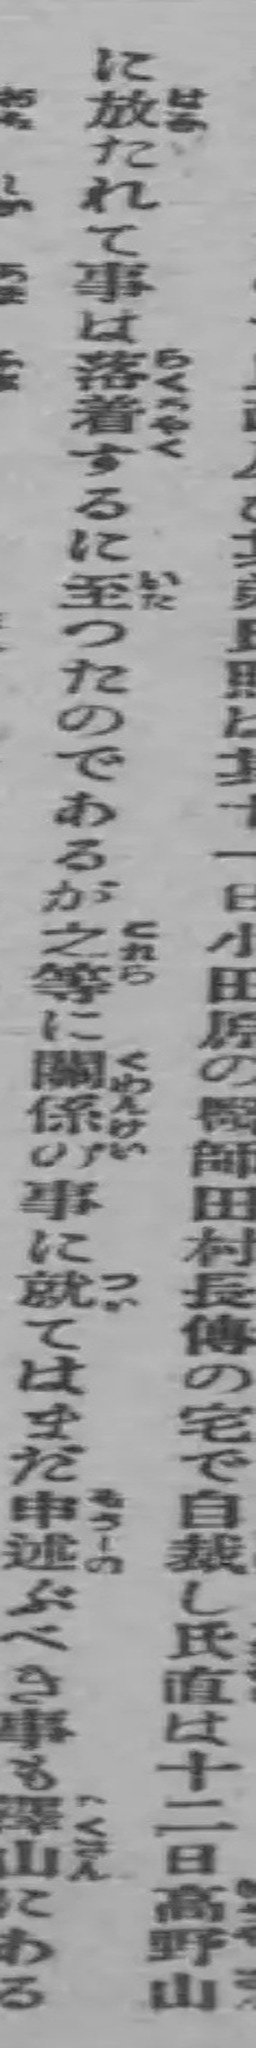に放たるに放たれて事は落着するに至つたのであるが之等に関係の事に就てはまだ申述ぶべき事も沢山にある
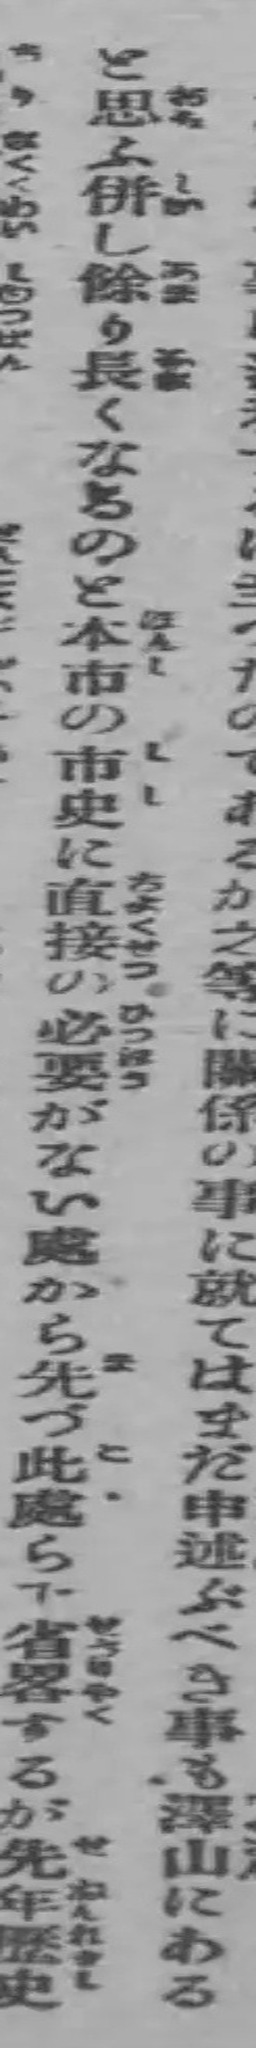と思ふ併し余り長くなるのと本市の市史に直接の必要がない処から先づ此処らで省略するが先年歴史
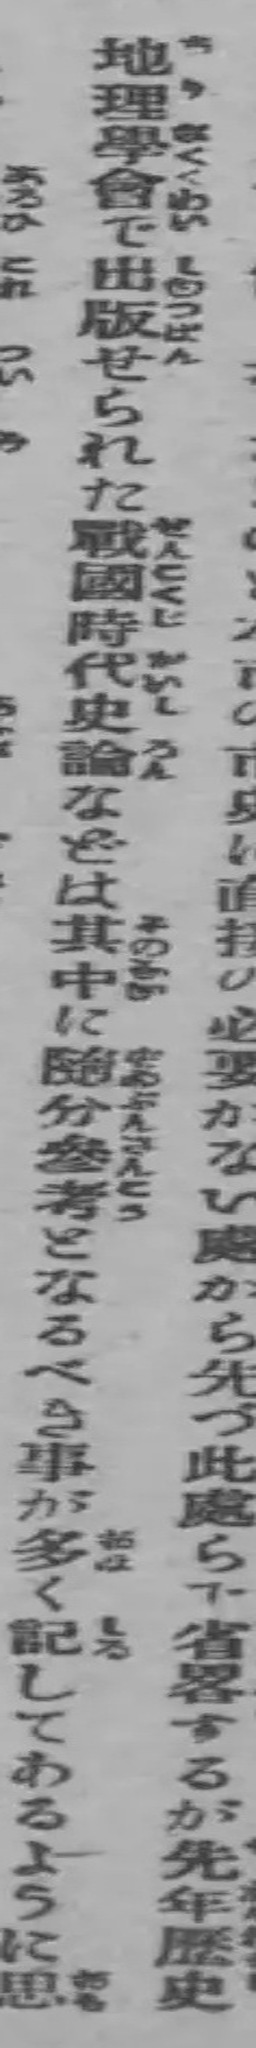地理学会で出版せられた戦国時代史論などは其中に随分参考となるべき事が多く記してあるように思
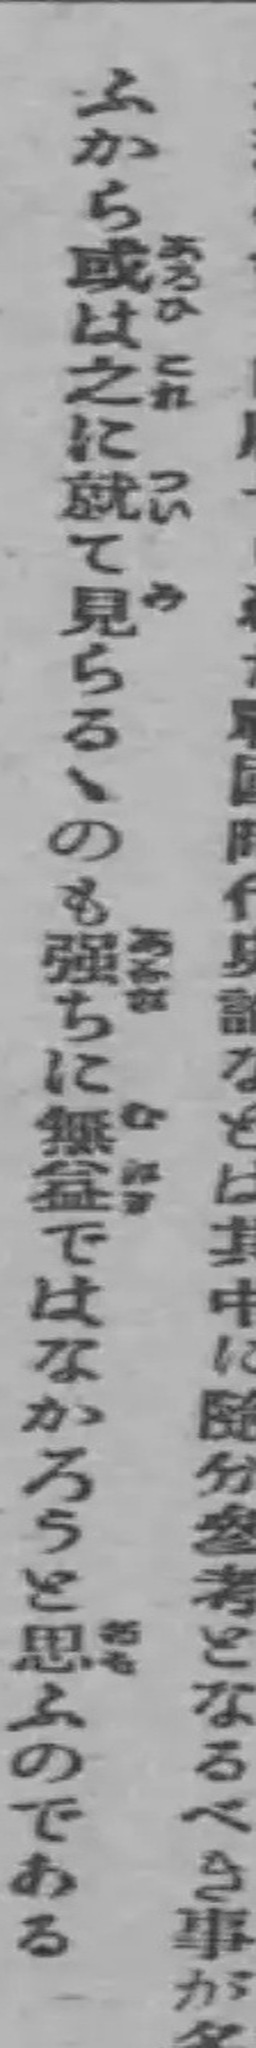ふから或は之に就て見らるゝのも強ちに無益ではなかろうと思ふのである
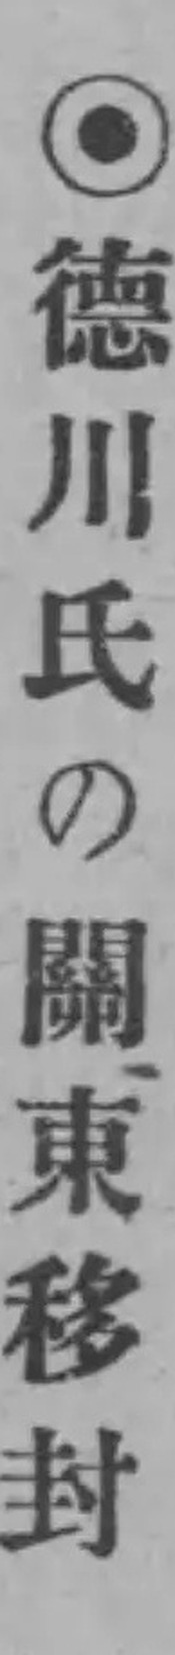⦿徳川氏の関東移封
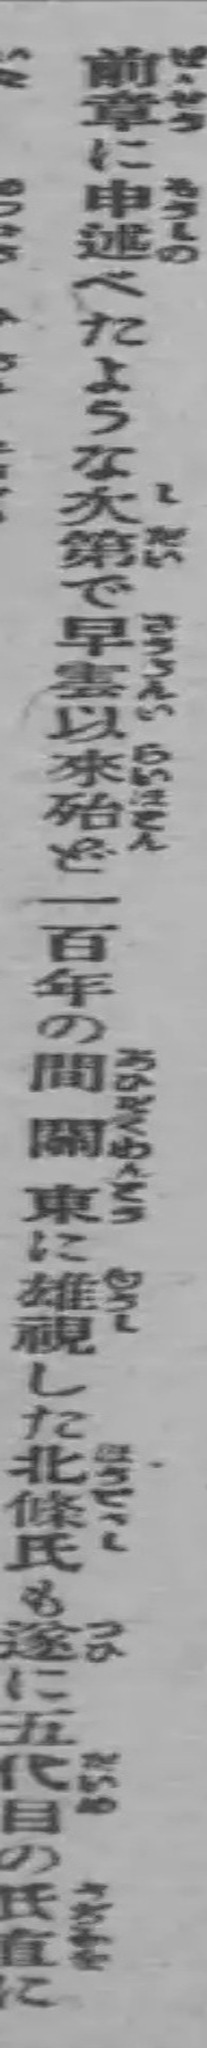前章に申述べたような次第で早雲以来殆ど一百年の間関東に雄視した北條氏も遂に五代目の氏直に

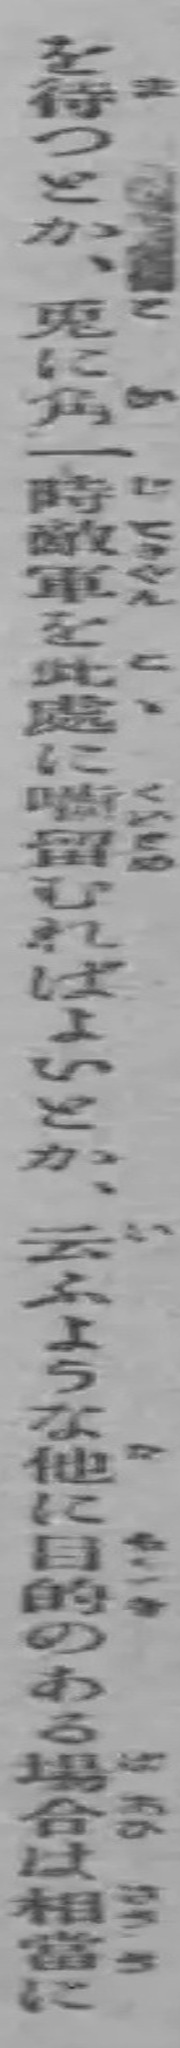を待つとか、兎に角一時敵軍を此処に噛留むればよいとか、云ふような他に目的のある場合は相当に
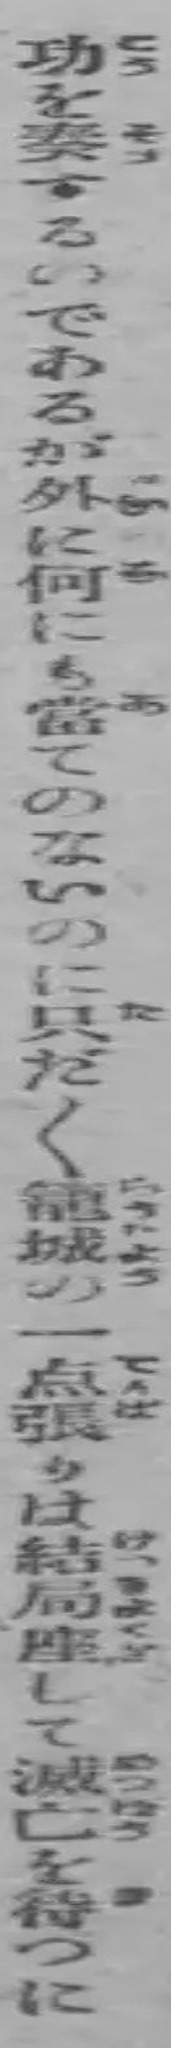功を奏するのであるが外に何にも当てのないのに只だ〳〵籠城の一点張りは結局座して滅亡を待つに
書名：豊橋市史談
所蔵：国立国会図書館 National Diet Library, JAPAN
